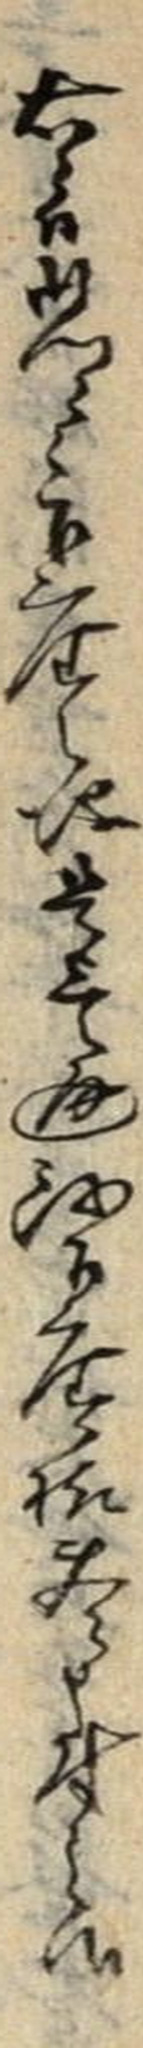右に付御門〳〵へ下座之儀是迄之通致下座候様夫々申付之候
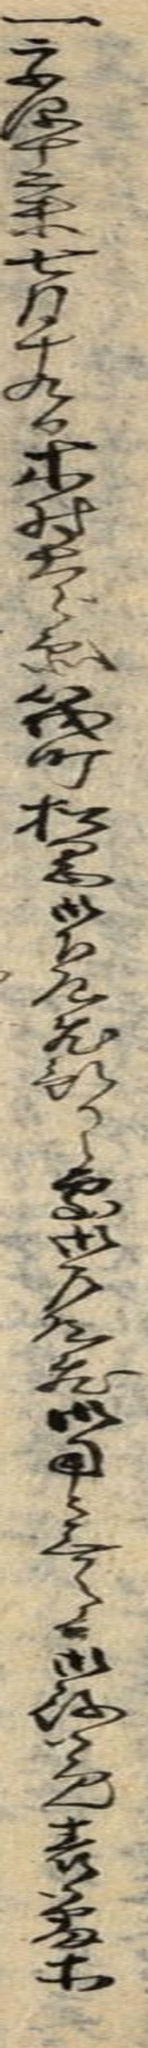一享保十二未七月十九日木村太郎兵衛筏町松岡御下屋敷預り之処御下屋敷御用に無之候に付御役御免表御番等
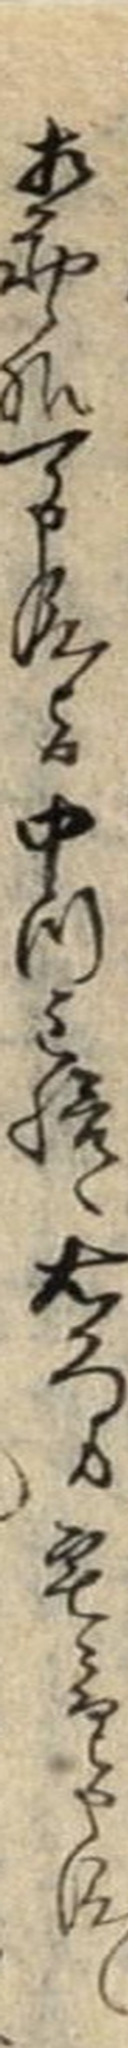相勤候様可申渡旨中川主膳へ右衛門方宅に而被申渡候
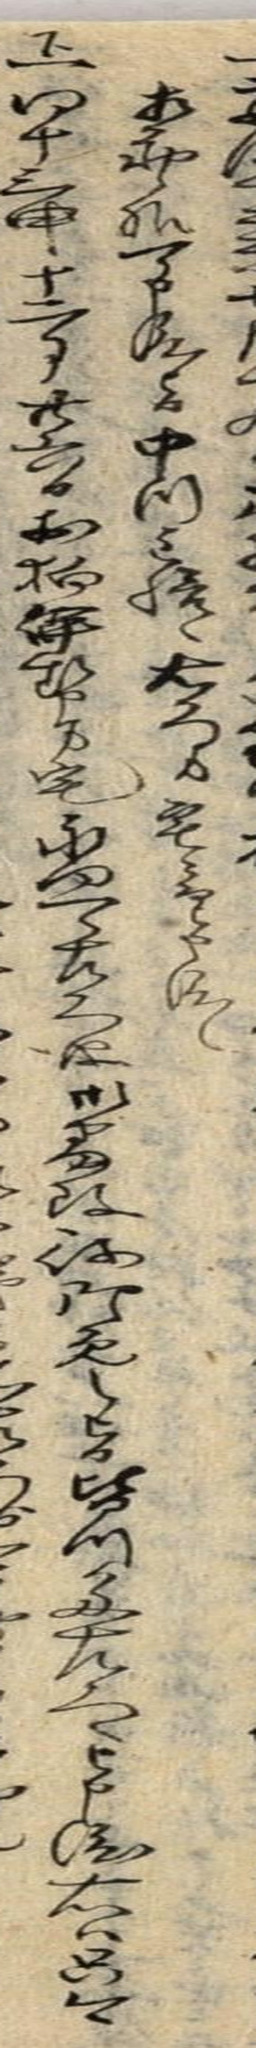一同十三申十二月廿六日於狛伊勢方宅永田一郎左衛門儀御番改役御免之旨皆川多左衛門へ被申渡右は只今
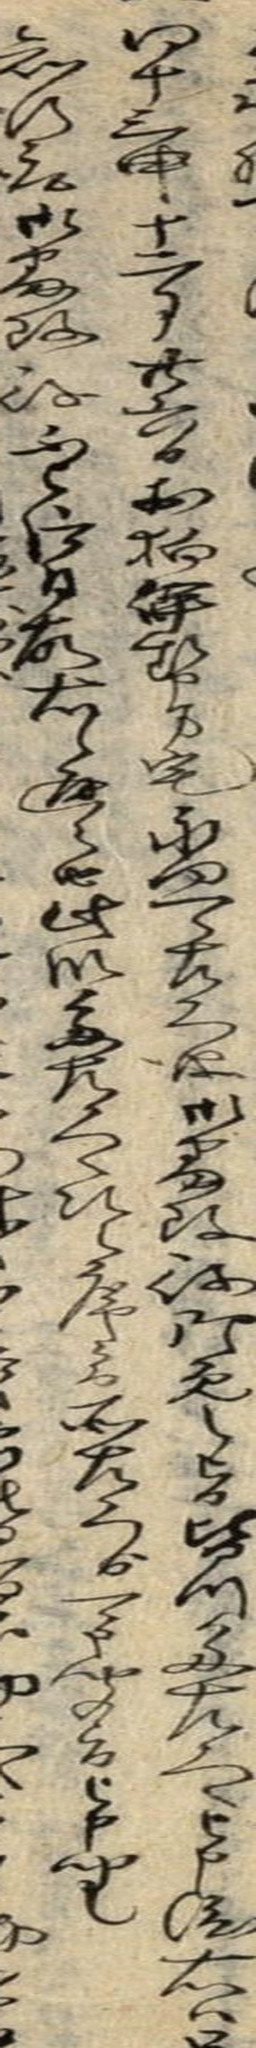知行取御番改役不被仰付故右之通之由此段多左衛門へ次之席に而所左衛門ゟ可申聞旨被申聞候
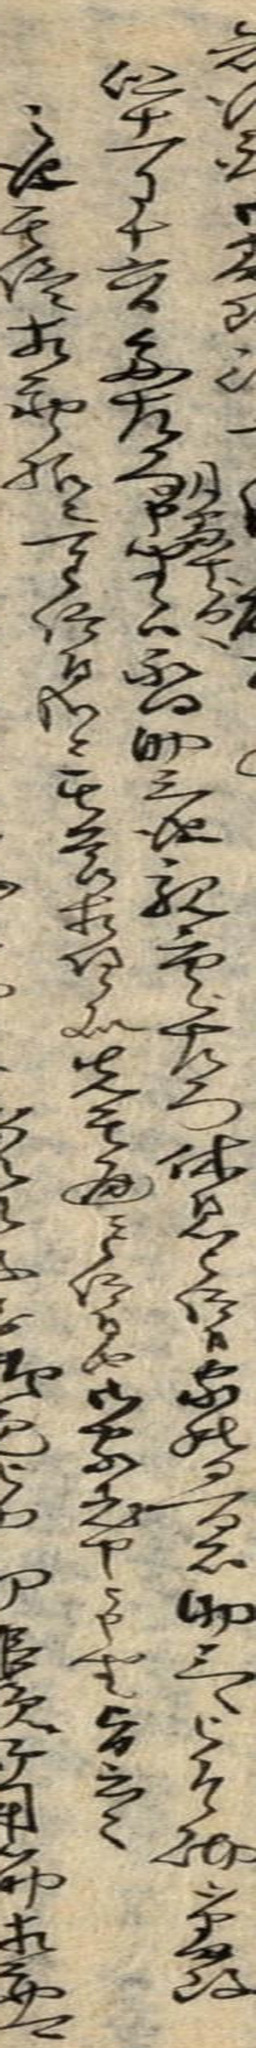之儀其侭相勤候様に可被仰付哉と其節相伺候処先其通に被仰付候由御家老中申聞候旨云々
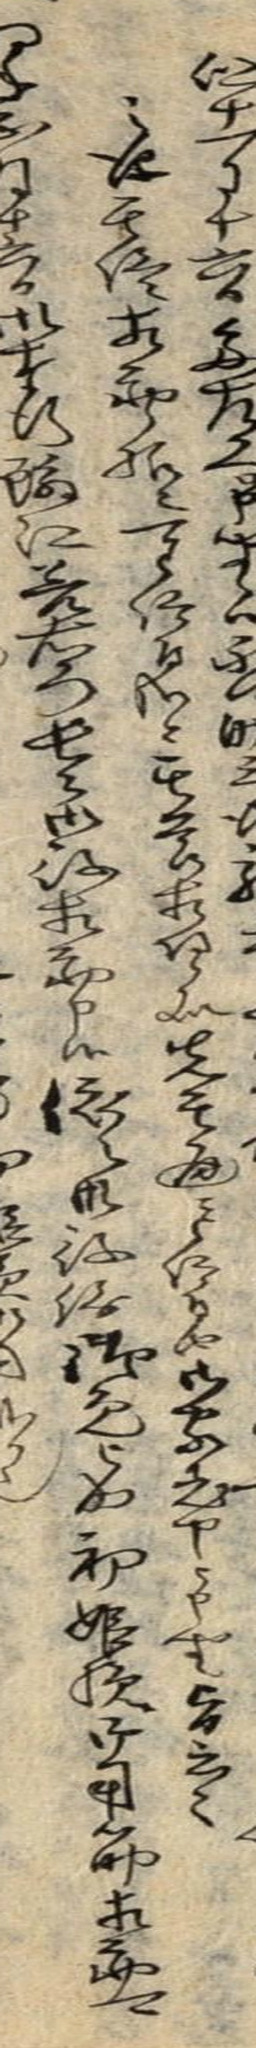一同年正月十六日御奉行蟹江善右衛門長々御役相勤申候依之御役儀御免被成初姫様御用筋相勤可
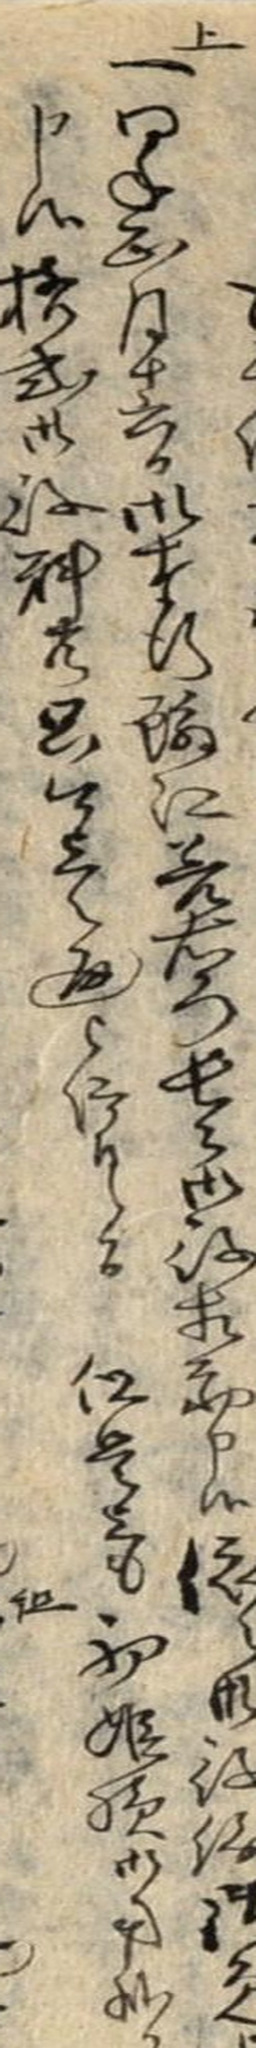申候格式御役料共只今迄之通被仰付候旨但是迄も初姫様御用掛り也
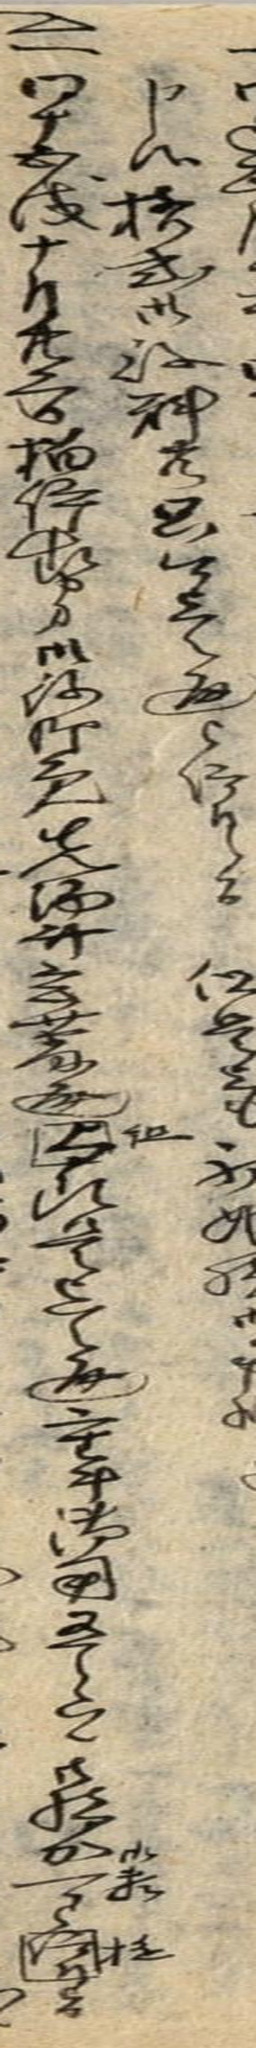一同十五戌十月廿二日狛伊勢方御役御免先酒井玄蕃通但与頭是迄之通重き御用有之候はゝ御指加御頼可被遊旨
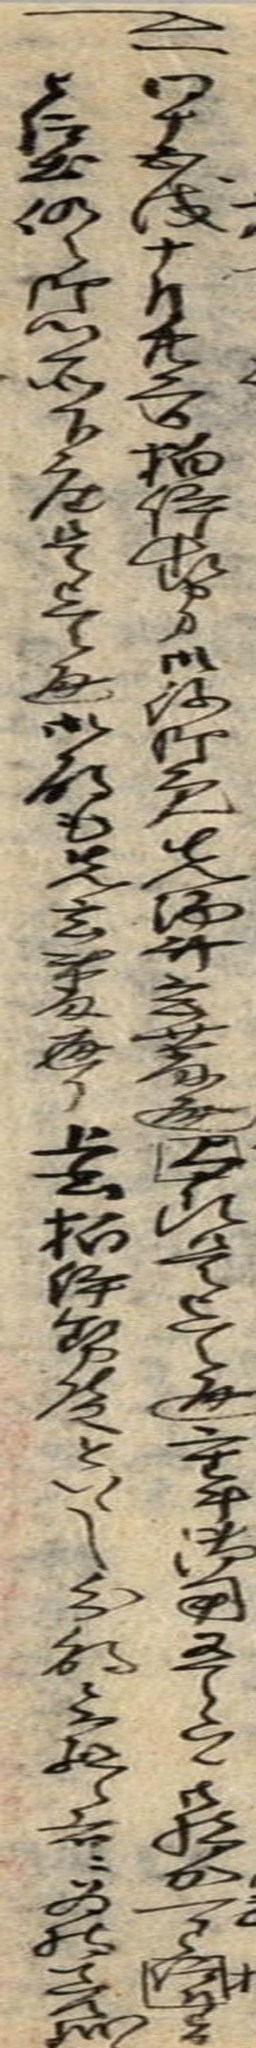被仰出仍之御門所下座是迄之通御触も先玄蕃通り上書狛伊勢殿といたし分触に而組之者に為持差越候
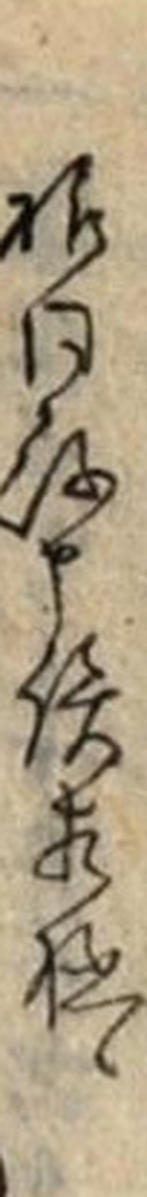様同役申談相極候
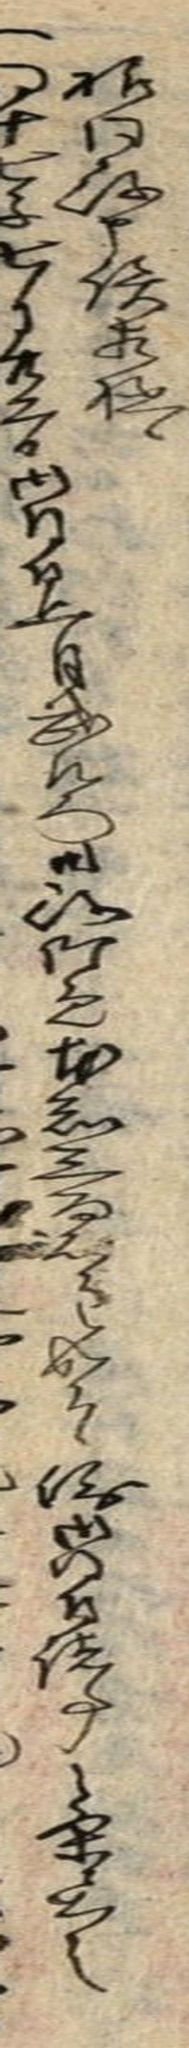一同十七子七月廿二日御目付上月武左衛門御役御免本知三百石に被成下候儀御目付諸事之条に出之
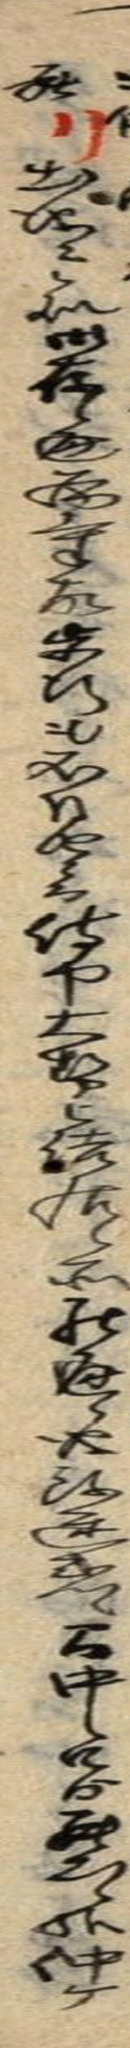罷出儀に候処御存之通病気故歩行も不自由に而侍中大勢被詰居候所罷通候儀致迷惑候間中之口ゟ罷出候様仲ヶ

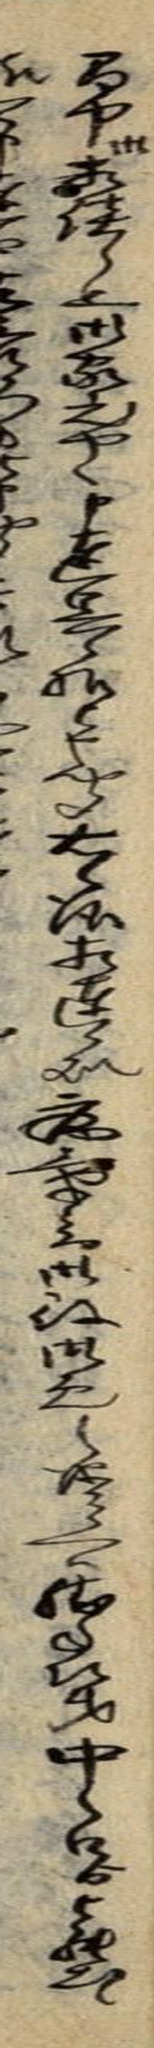間中御相談之上御家老中へ申達呉候様被申聞右之趣相達候処病気に而御役御免之儀に候へは勝手次第中之口ゟ被罷出候
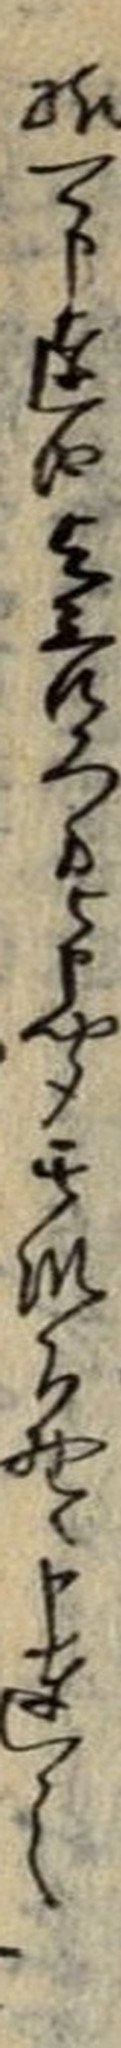様可申達由与三左衛門方被申聞其段下野へ申達之
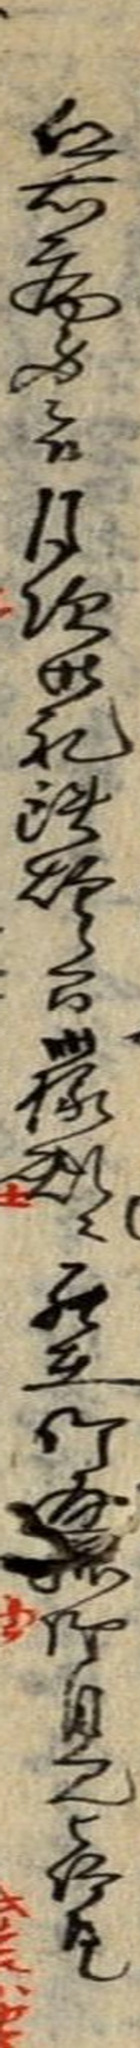但右病身に付月次御礼鉄炮之間御縁頬に罷在御通掛御目見被仰付候
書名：御用并被仰出之部
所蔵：福井県文書館 Fukui Prefectural Archives
